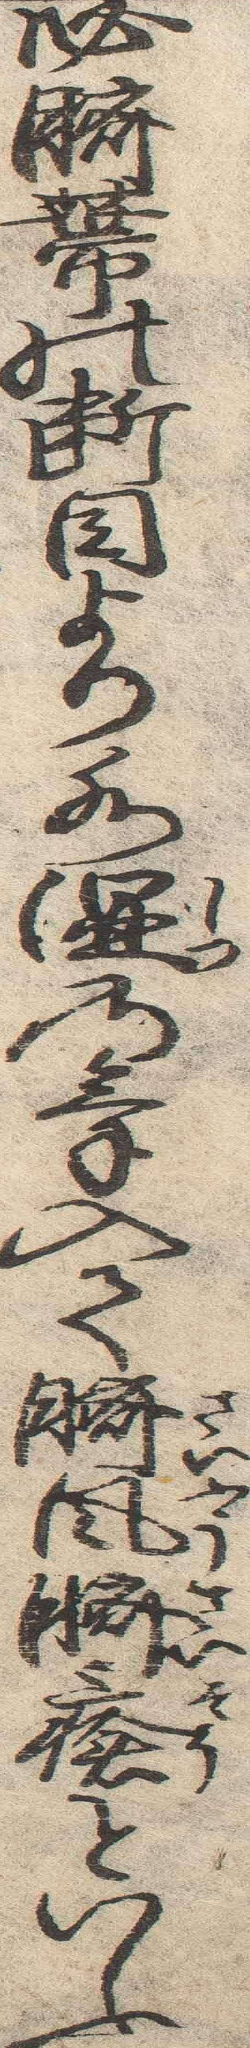必臍蔕の断目より水湿の氣入て臍風臍瘡といふ
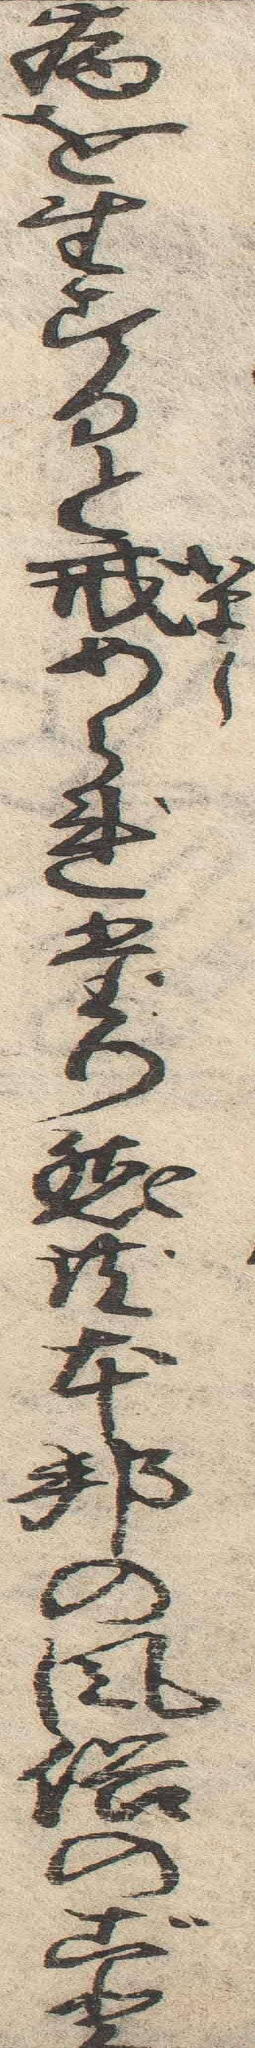病を生すると戒められたり然共本邦の風俗のごと
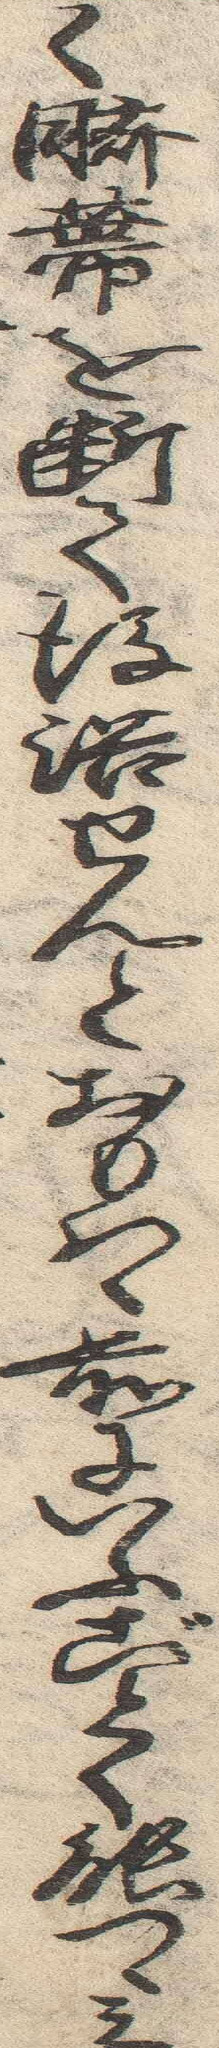く臍蔕を断て後浴せんとおもはゝ前にいふごとく能つゝみ
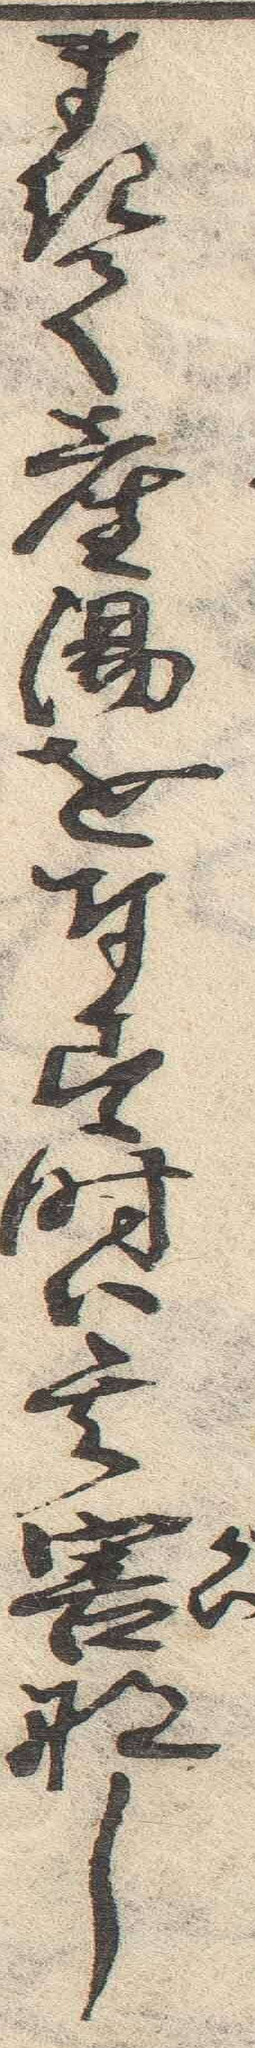まきて産湯をなす時は其害なし
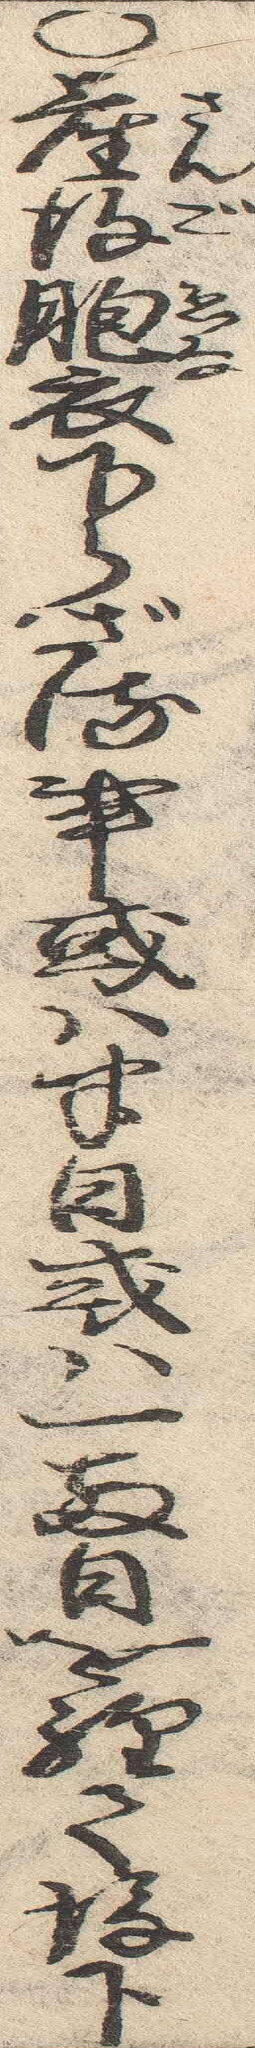◯産後胞衣下らざる事或は半日或は一両日を経て後下
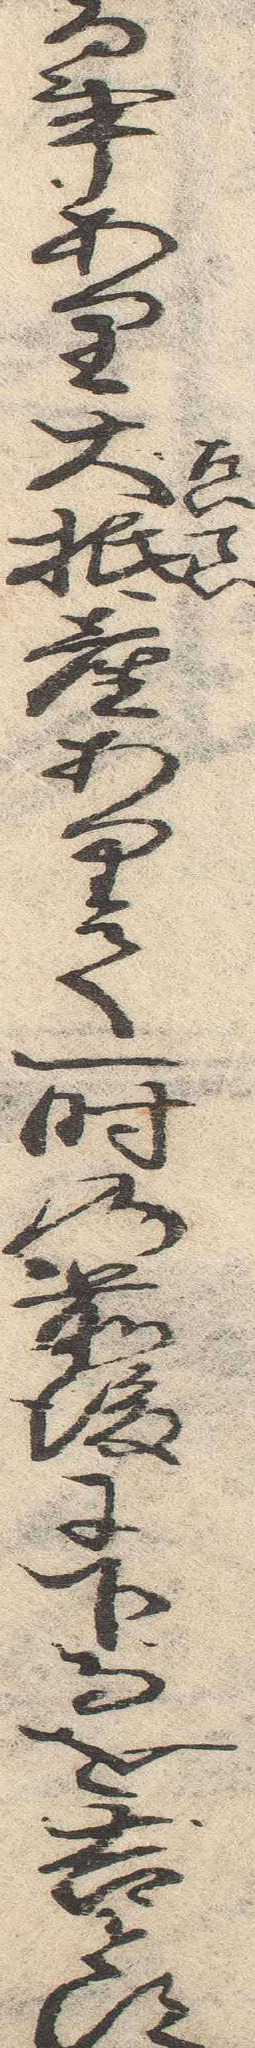る事あり大抵産ありて一時の前後に下るを吉とす
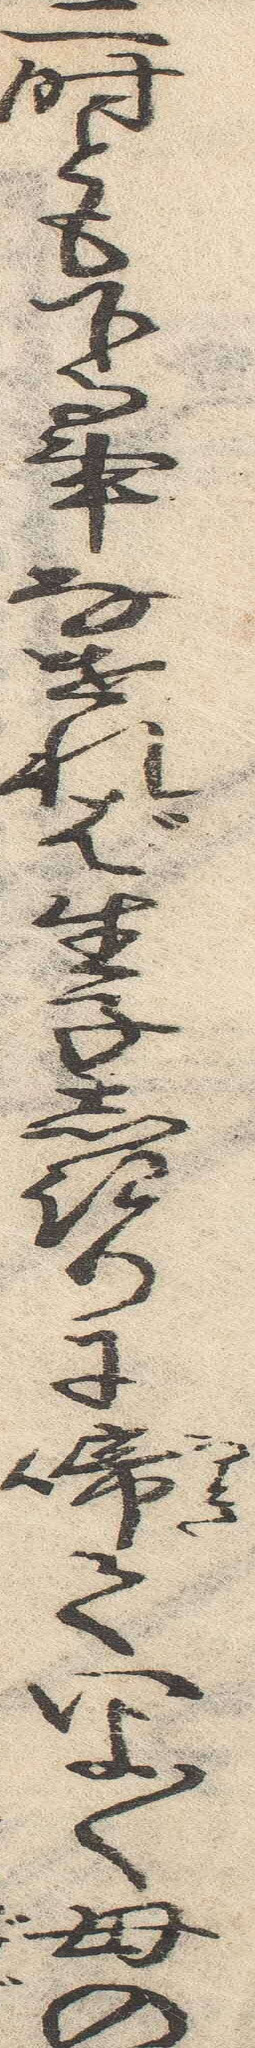二時とも下る事なければ生子しきりに啼ていよ〳〵母の
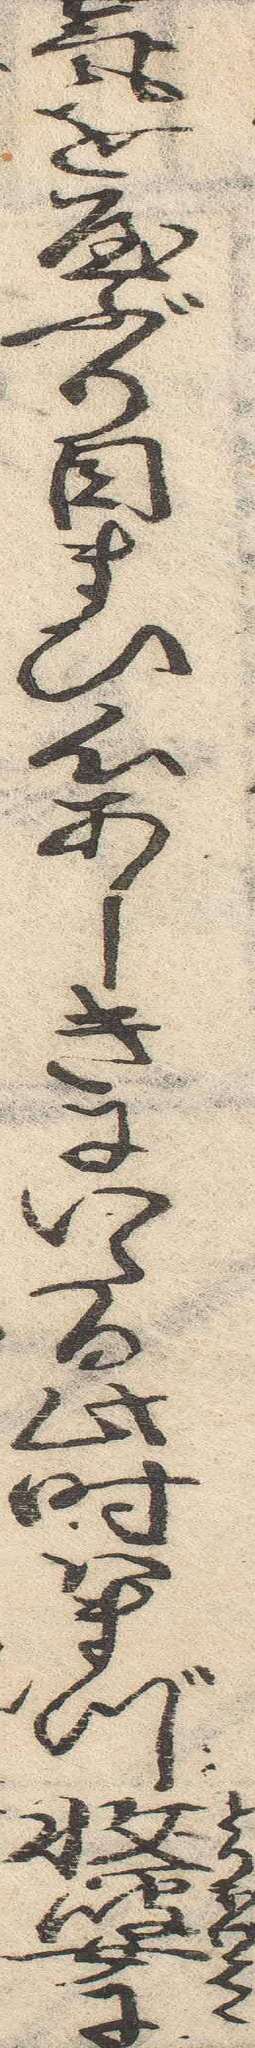気をやぶり目まひ心あしきにいたる此時はまづ収婆に
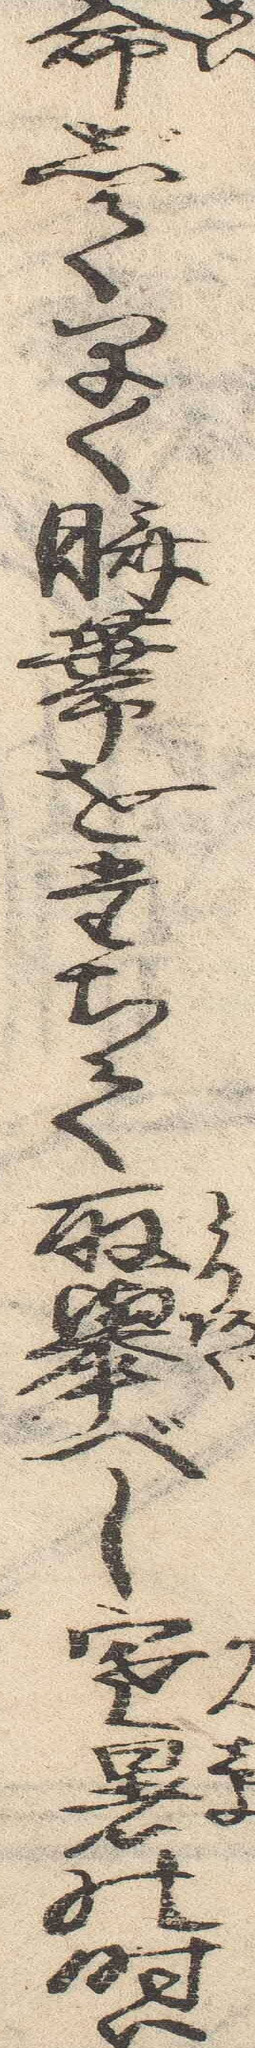命じて早く臍蔕をたちて取擧べし寒暑の時は
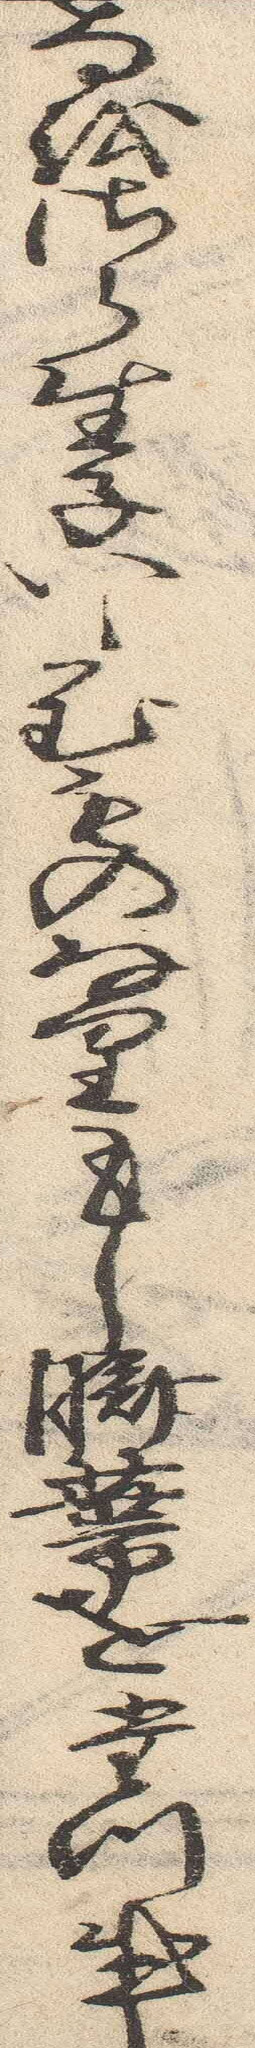なおさら生子いたむものなりもし臍蔕をたつ事
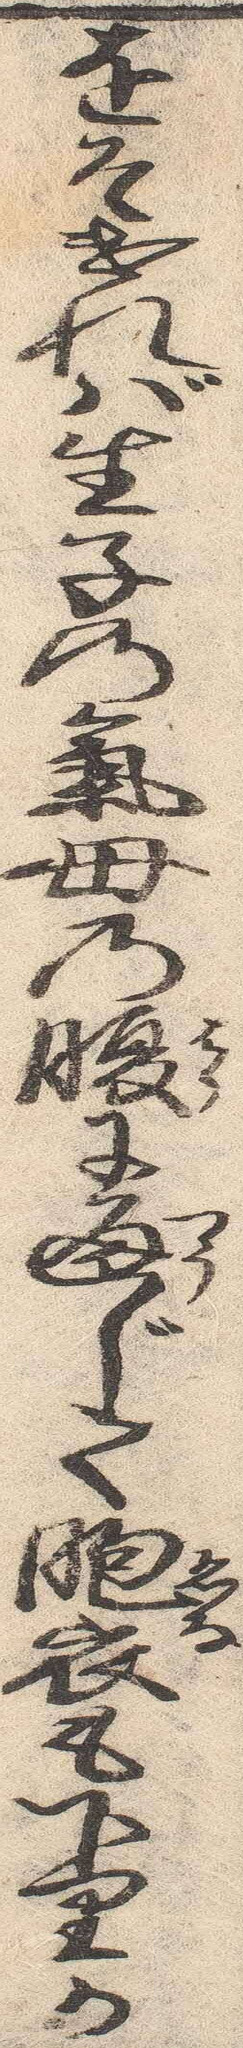をそければ生子の氣母の腹に通じて胞衣も下りか
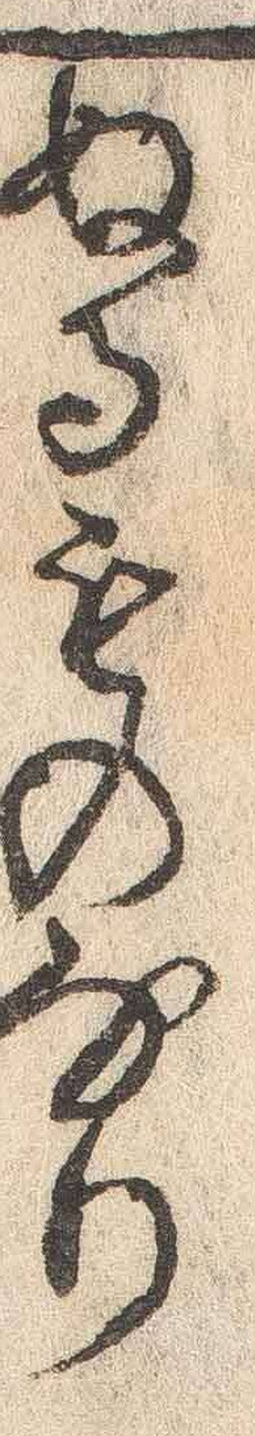ぬるものなり
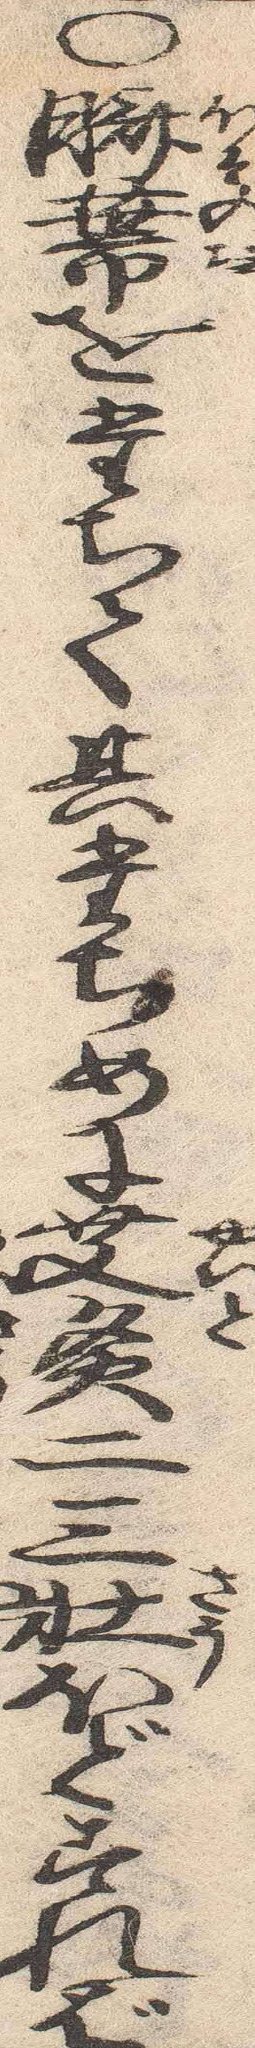◯臍蔕をたちて其たちめに艾灸二三壮ほどすれば
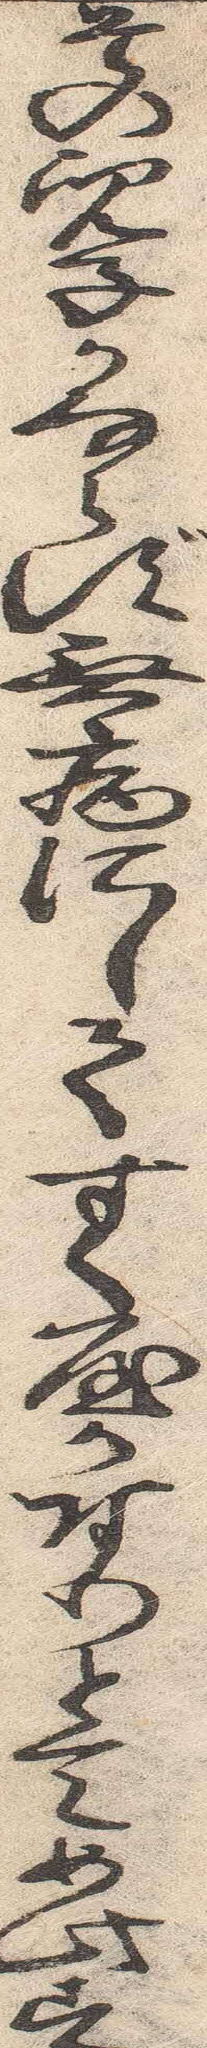その児子かならず無病にしてすくやかなりとてめ此す
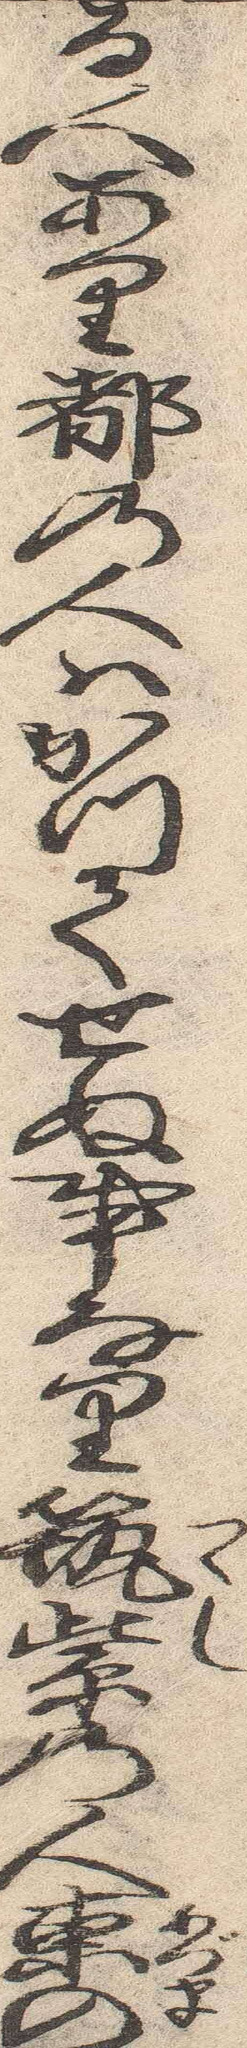る人あり都の人はかつてせぬ事なり筑紫の人東の
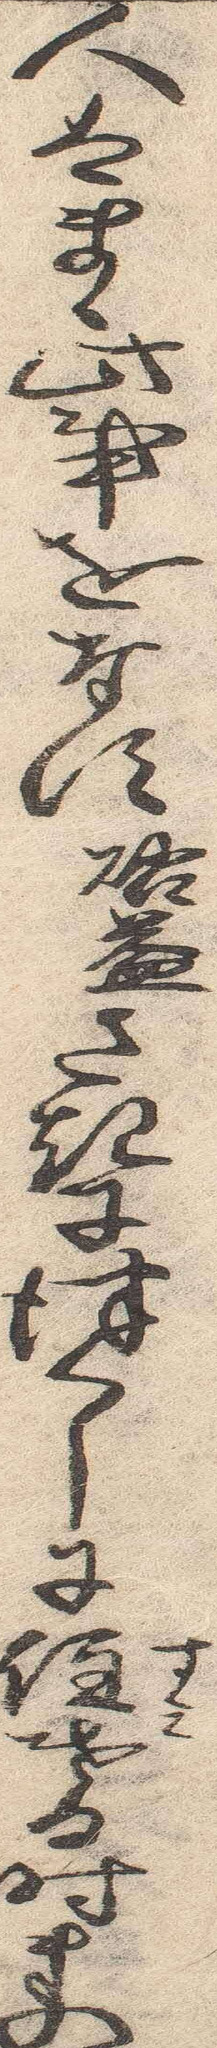人はまゝ此事をなす啓益さきにつくしに住ける時まの
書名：小児必用養育草
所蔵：東京学芸大学附属図書館 国文学研究資料館
